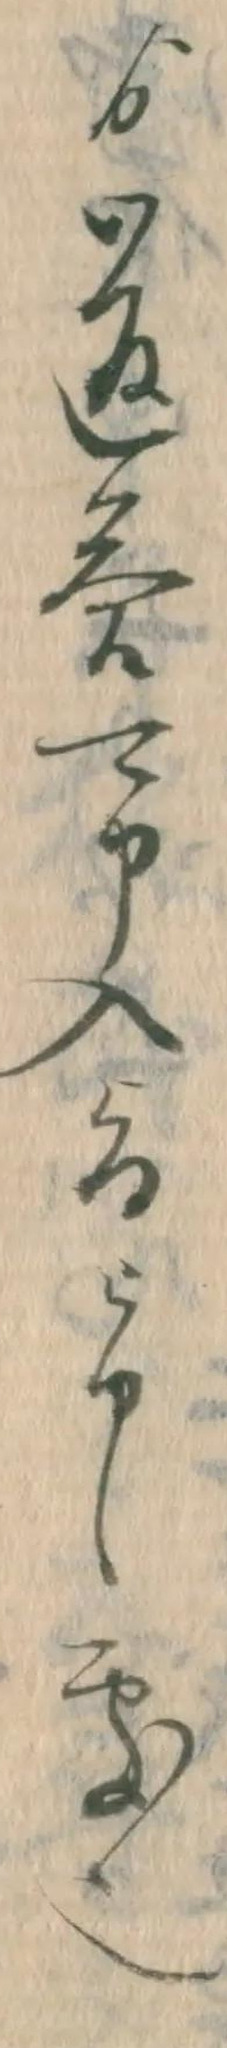ゟ御返答可申入旨被申候処也
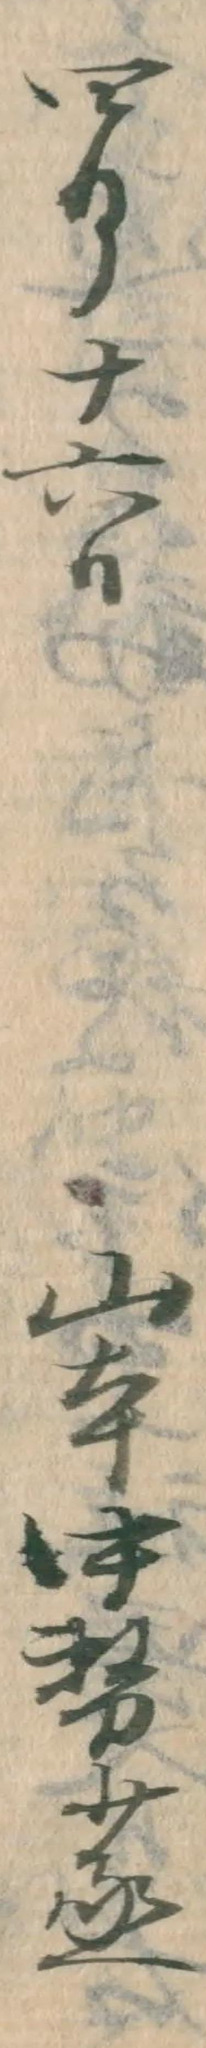四月十六日山本中務少丞
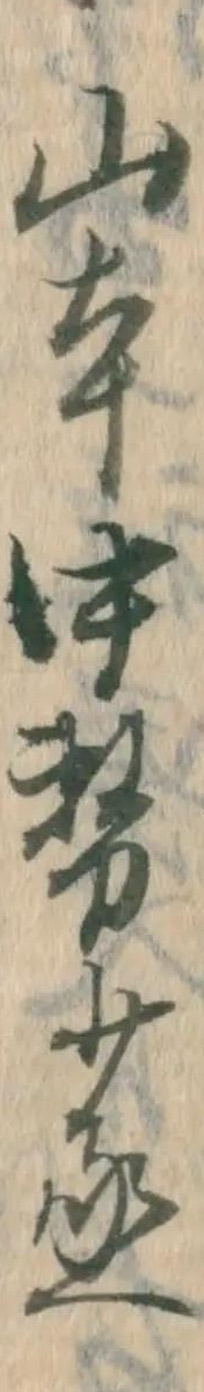山本中務少丞殿
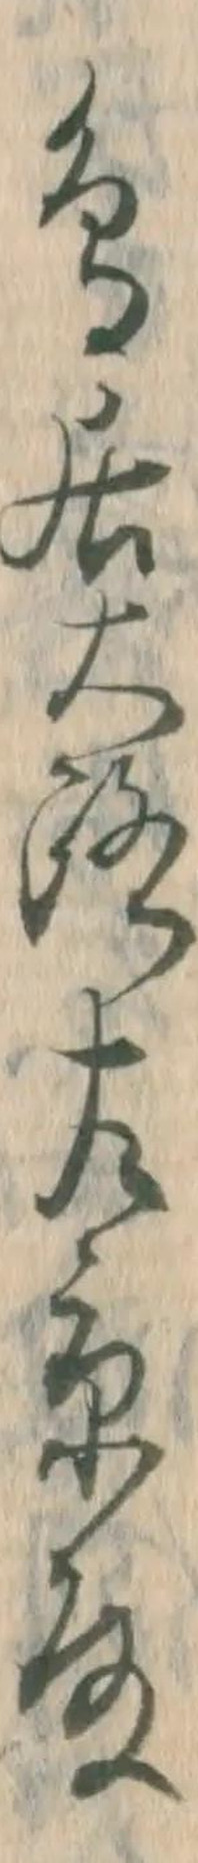鳥居大路左京殿
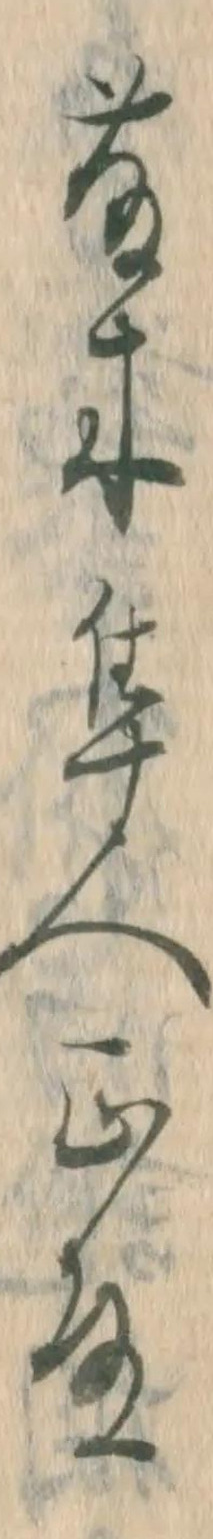藤木隼人正殿
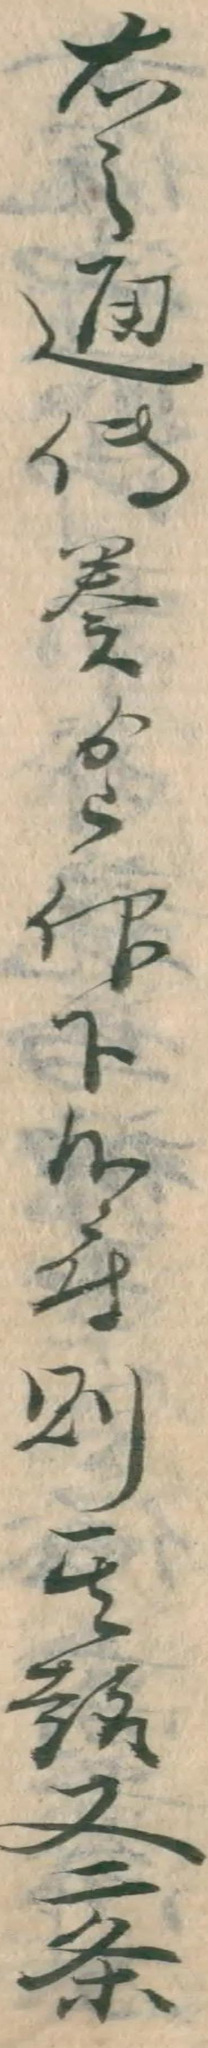右之通伝奏ゟ被仰下候ニ付則其趣又二条

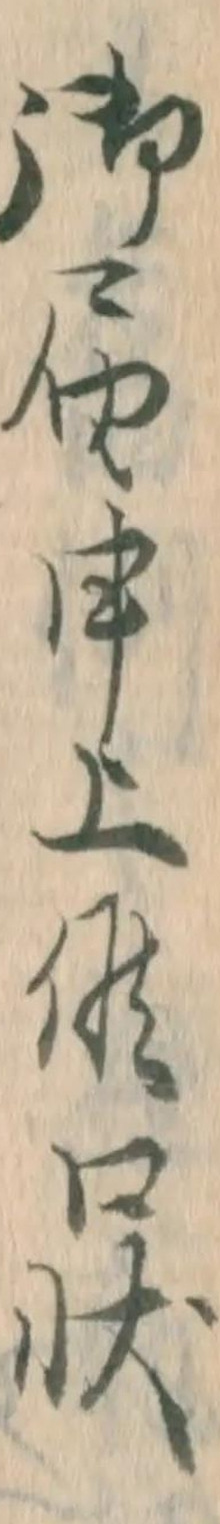御届申上候口状
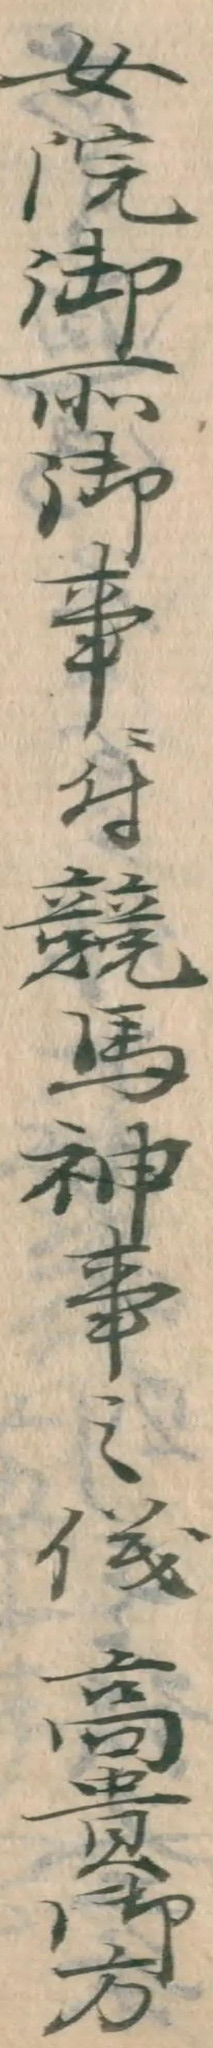女院御所御事ニ付競馬神事之儀高貴御方
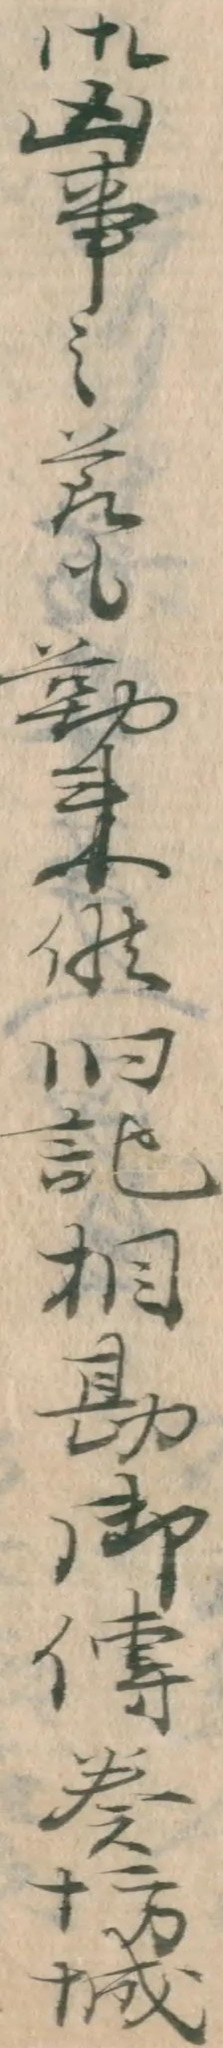御凶事之節も勤来候旧記相勘御伝奏坊城
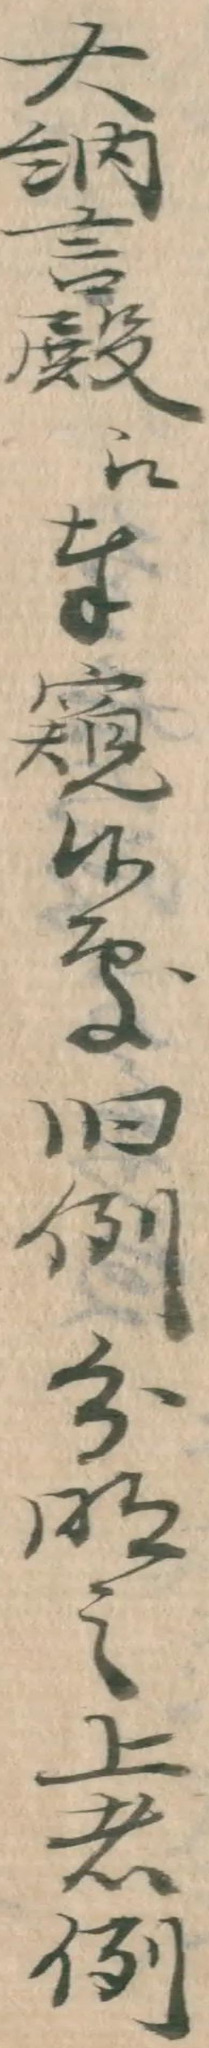大納言殿江奉窺候処旧例分明之上者例
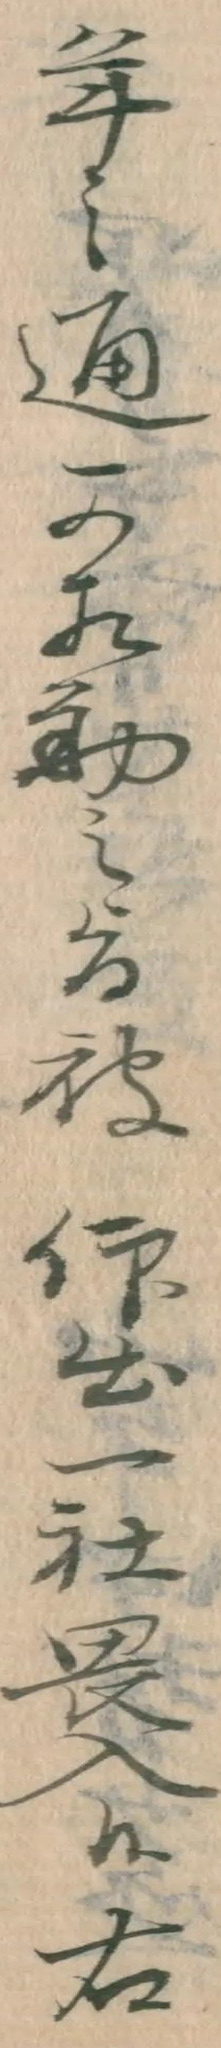年之通可相勤之旨被仰出一社畏入候右
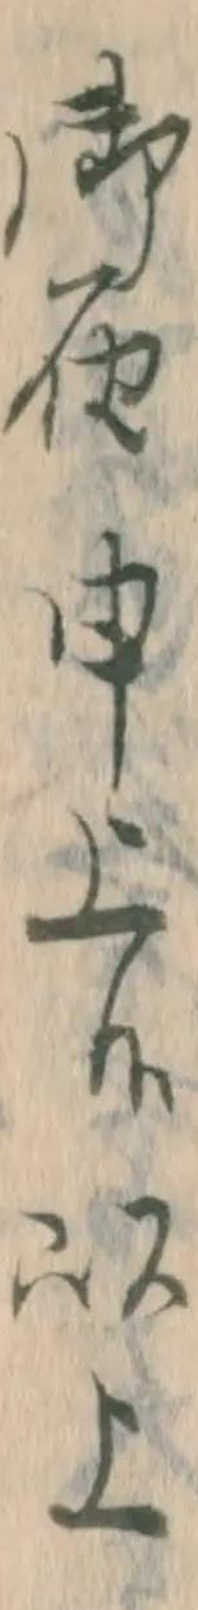御届申上候以上
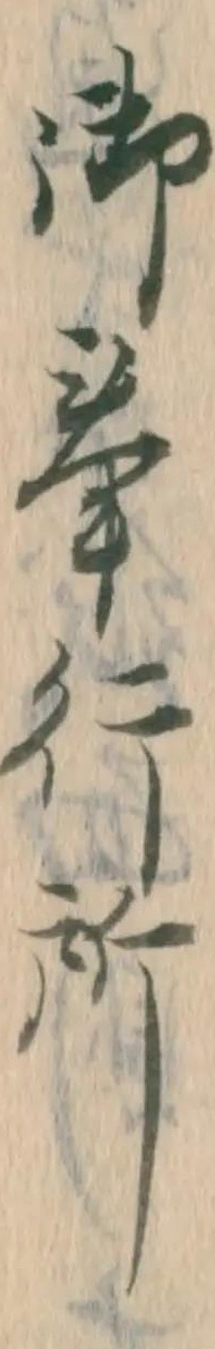御奉行所
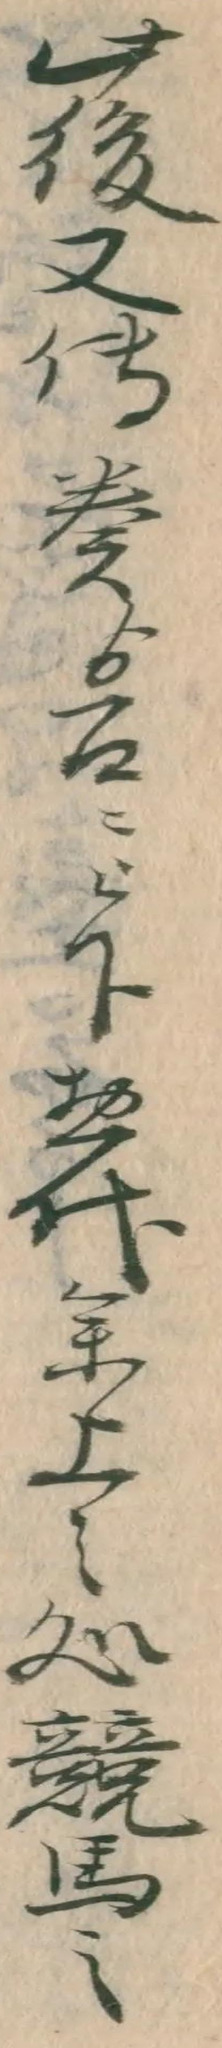此後又伝奏ゟ召ニ被下惣代参上之処競馬之
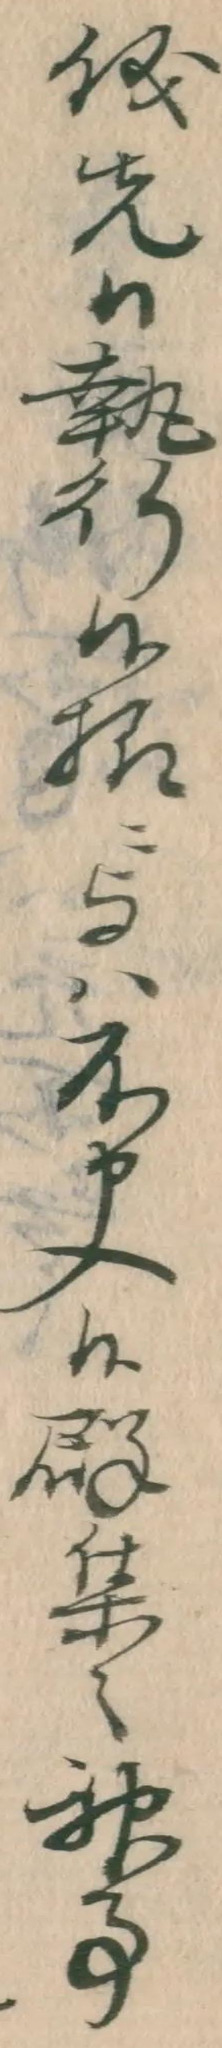儀先日執行候様ニ与ハ不申入候群集之神事
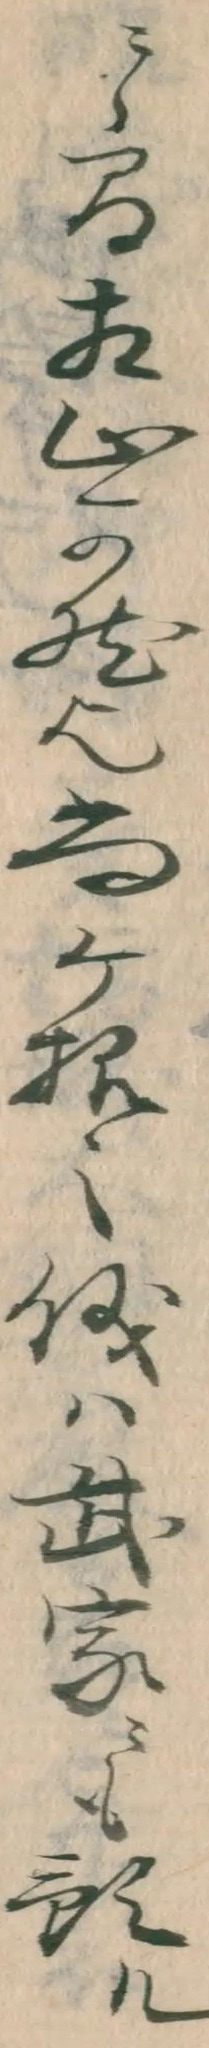ニ候間相止可然歟尚ケ様之儀ハ武家ニも預ル
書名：賀茂社記録. 第10冊
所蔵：国立国会図書館 National Diet Library, JAPAN
